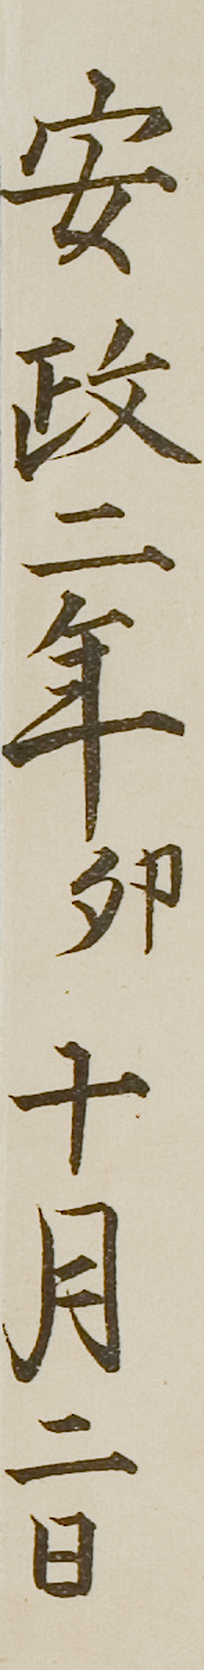安政二年卯十月二日

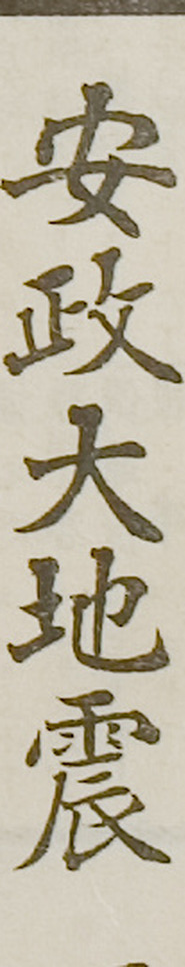安政大地震
